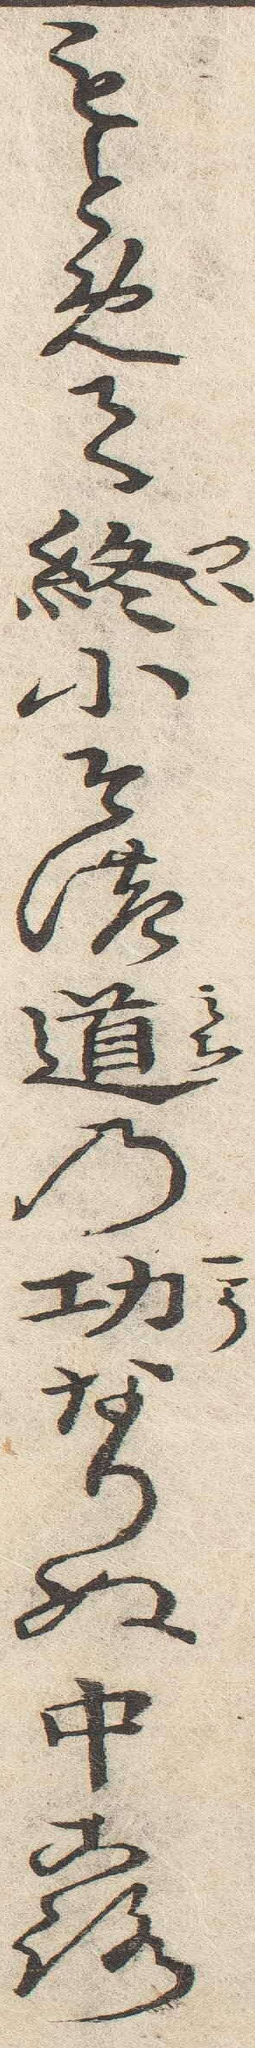もとめて終にその道の功なりぬ中ころ
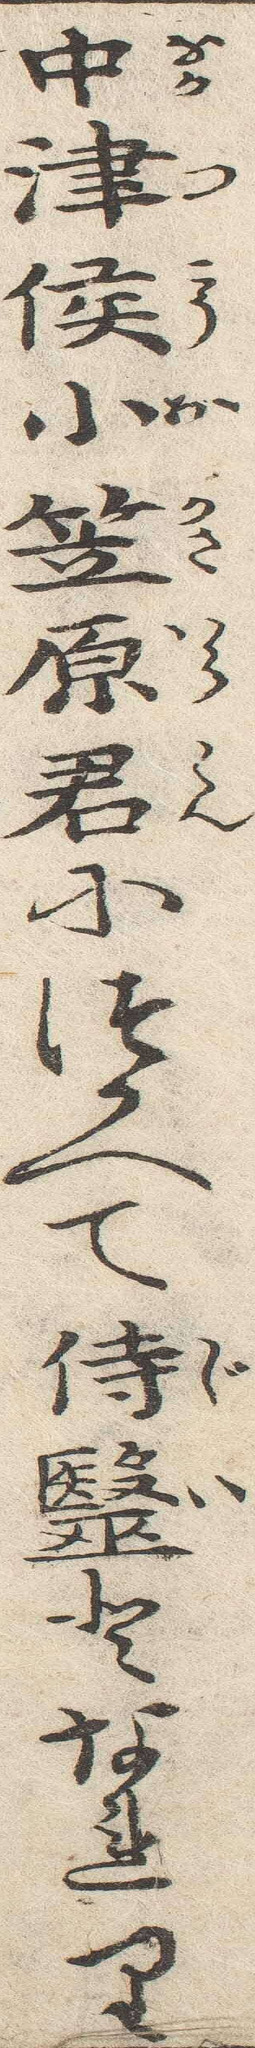中津侯小笠原君につかへて侍毉となれり
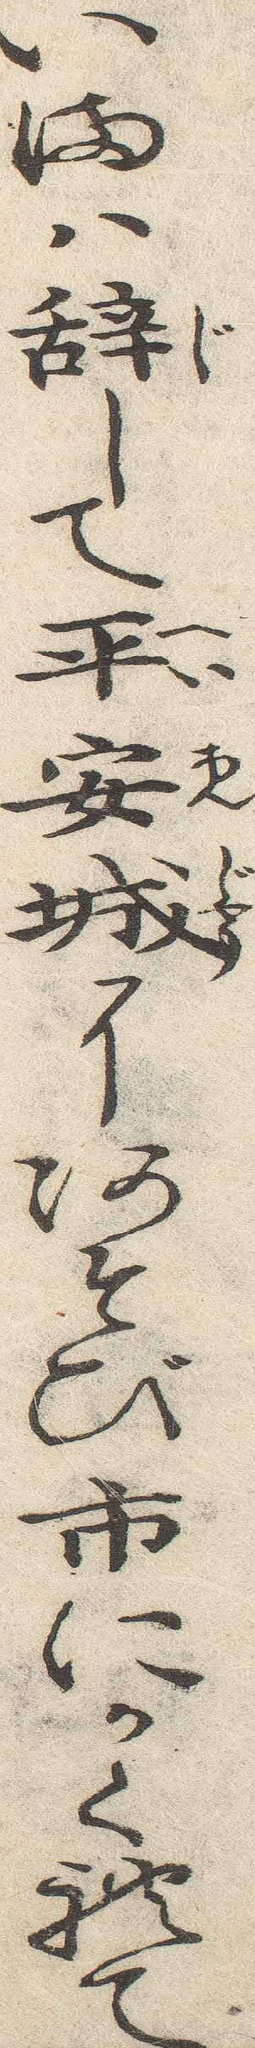いまは辞して平安城にあそび市にかくれて
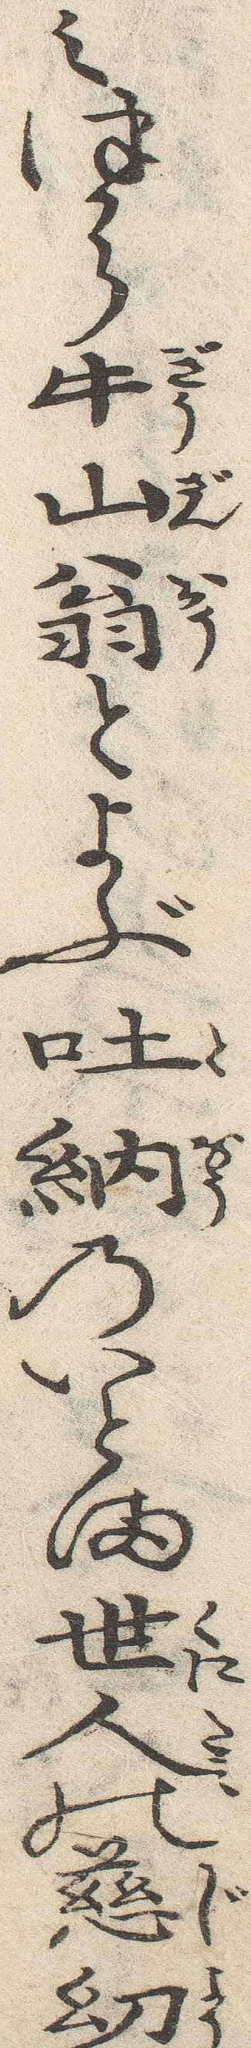みつから牛山翁とよぶ吐納のいとま世人の慈幼
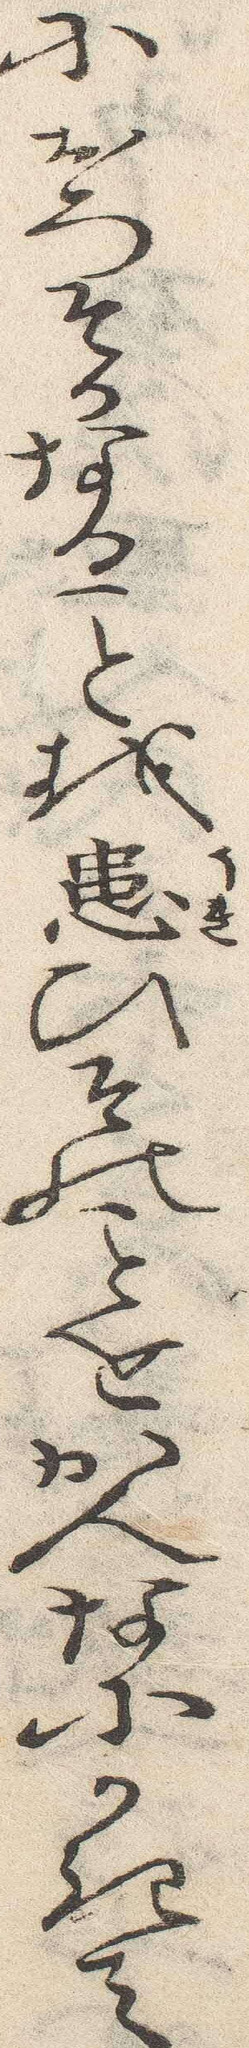におろそかなることを患ひそのことをかんなにかきて
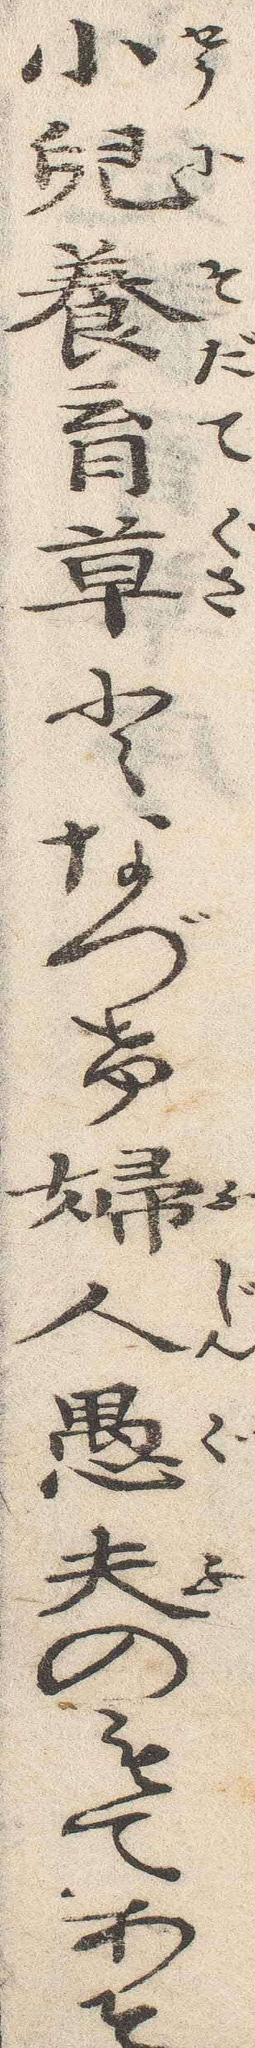小兒養育草となづけ婦人愚夫のもてあそ
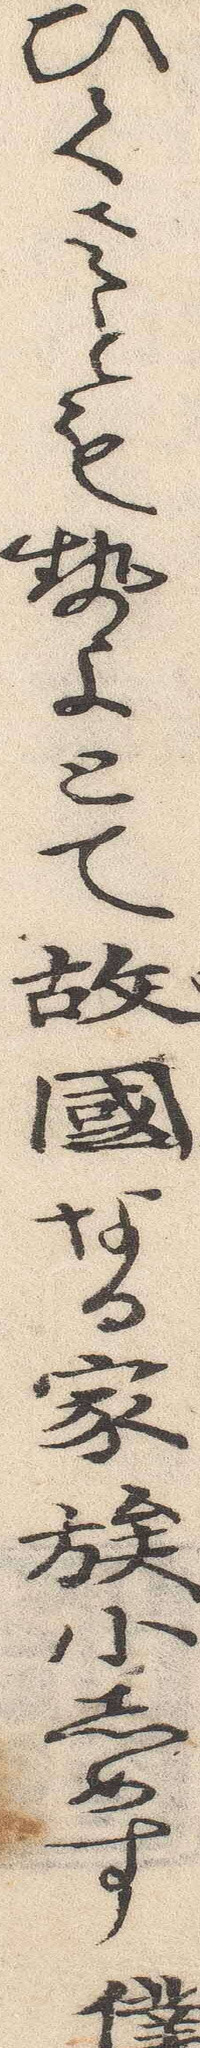ひくさともせよとて故國なる家族にしめす僕
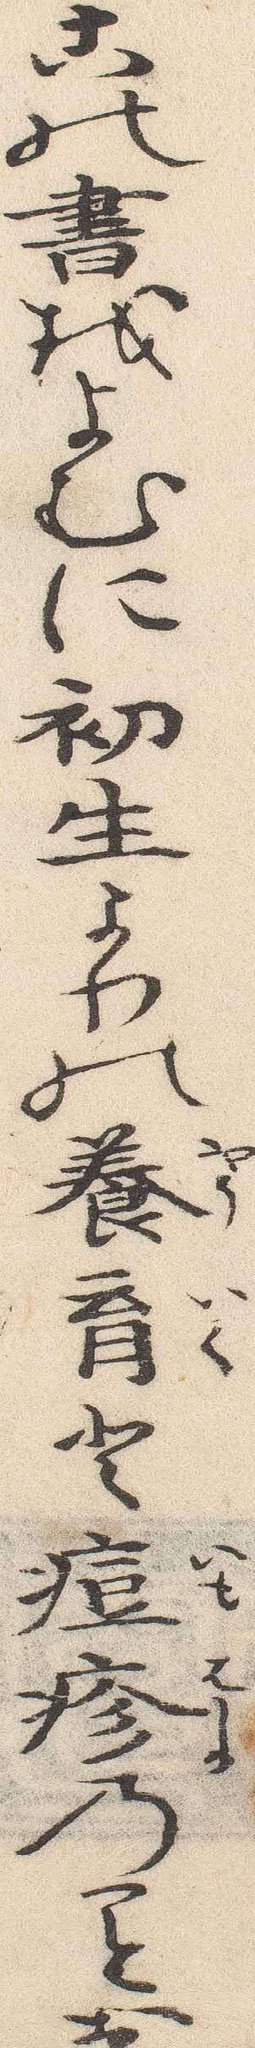この書をよむに初生よりの養育と痘疹のことお
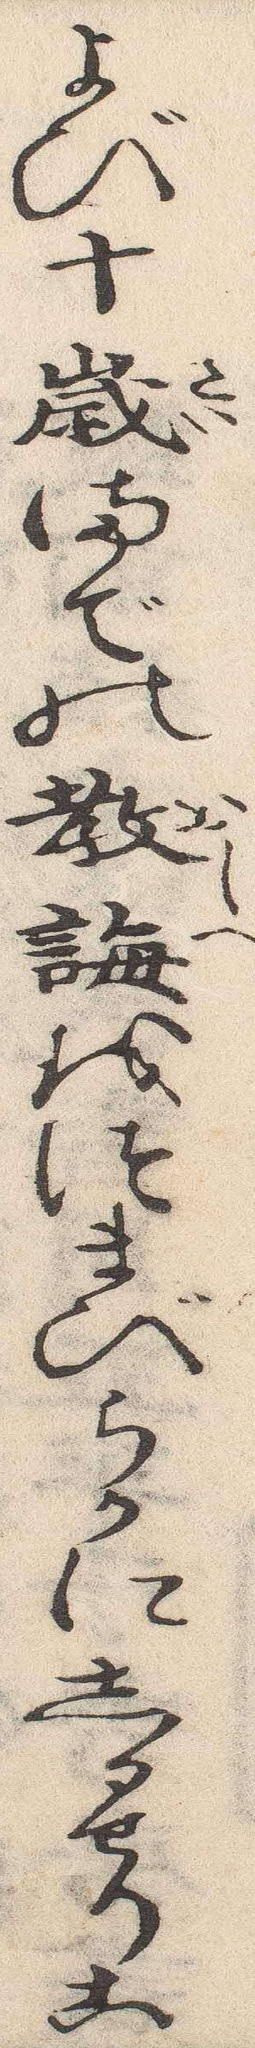よび十嵗までの教誨をつまびらかにしるせりこ
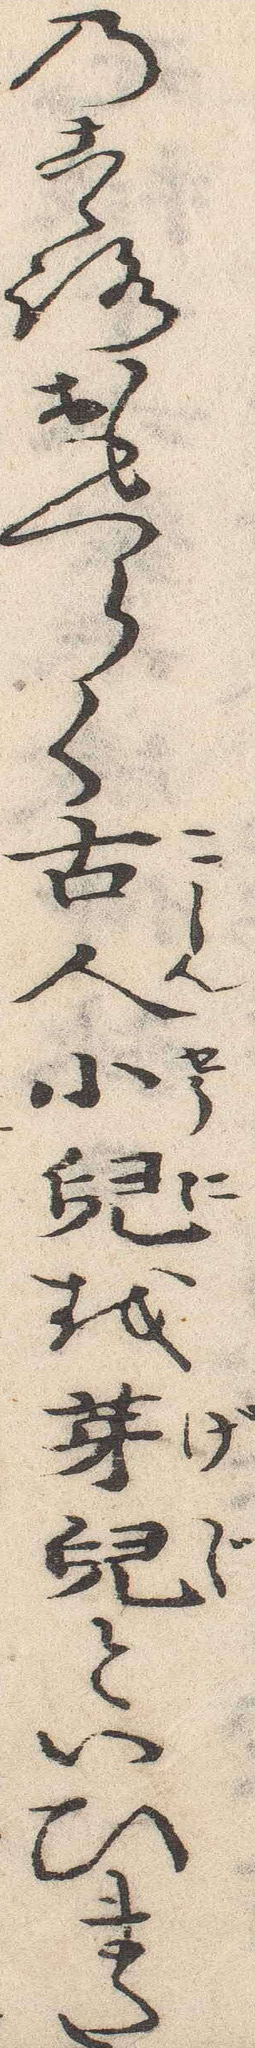のこゝろおもへらく古人小兒を芽兒といひまた
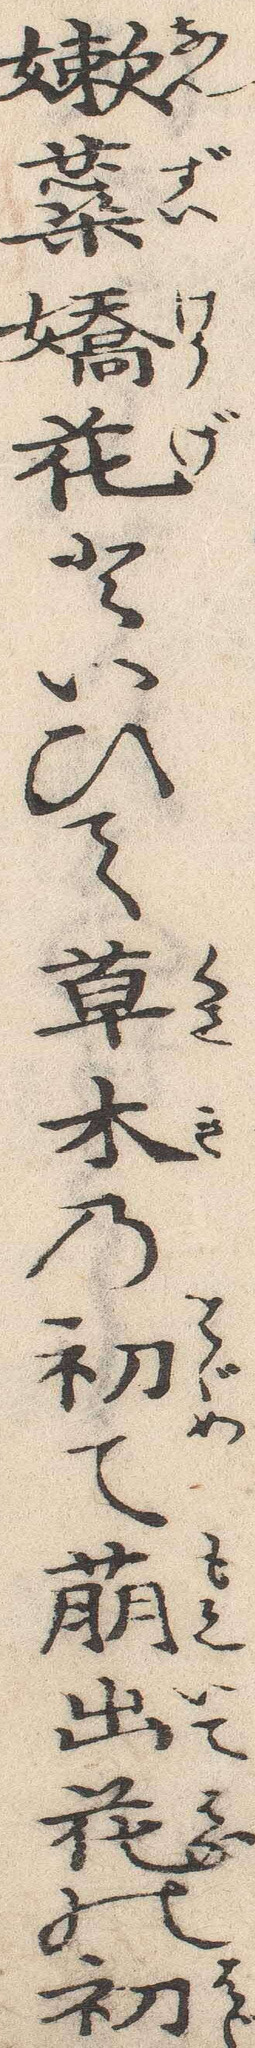㜛蘂嬌花といひて草木の初て萌出花の初
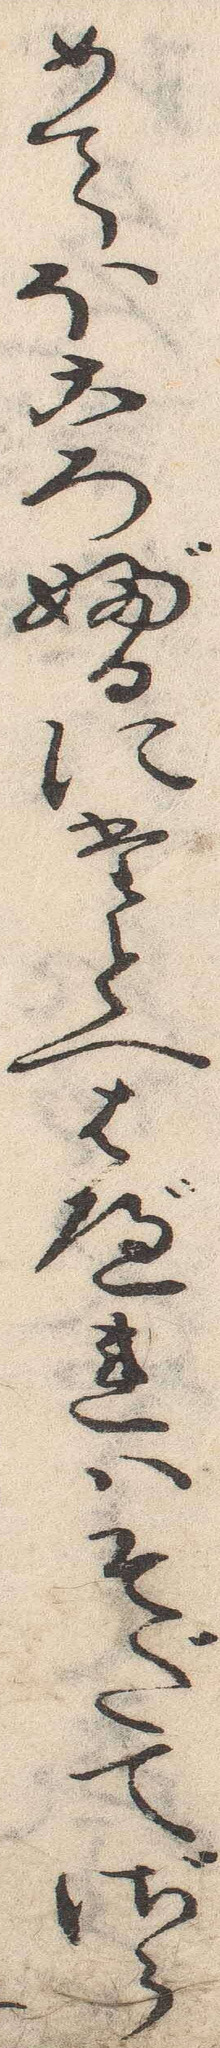めてほころぶるにたとへはべれはそだてざら
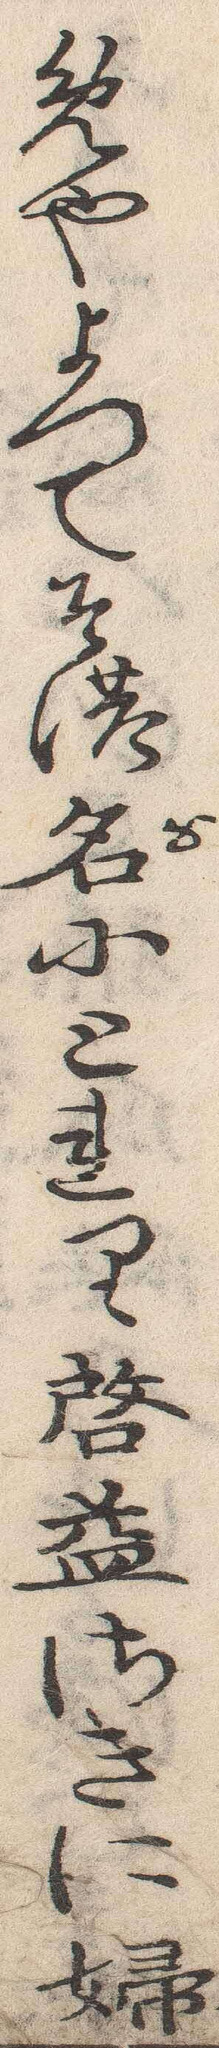めやよつてその名にとれり啓益さきに婦
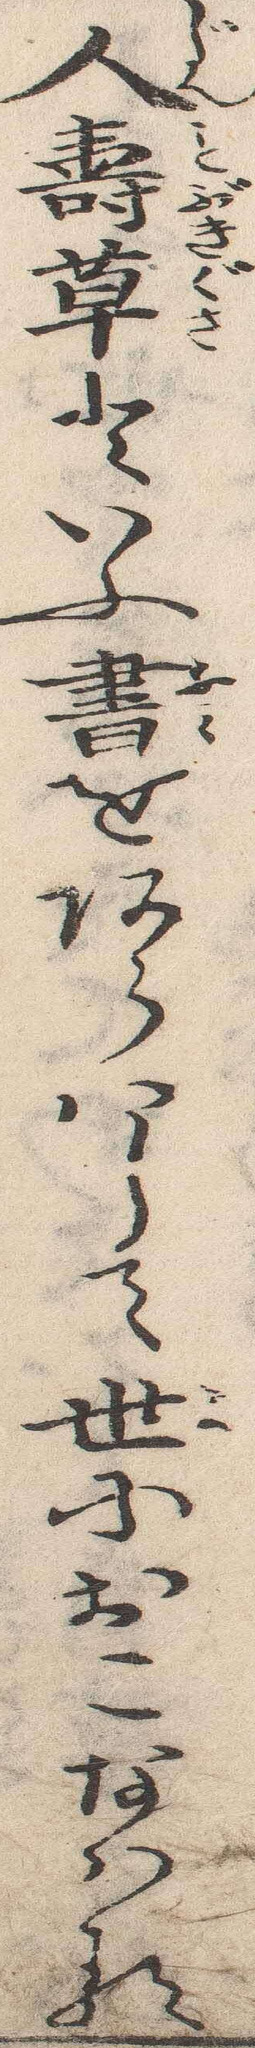人壽草といふ書をあらはして世におこなはる
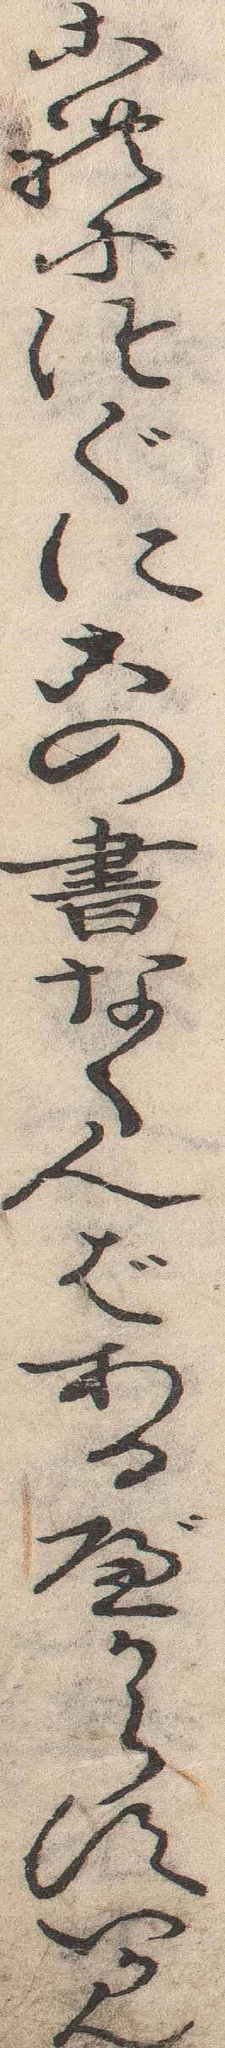これにつぐにこの書なくんばあるべからすいかん

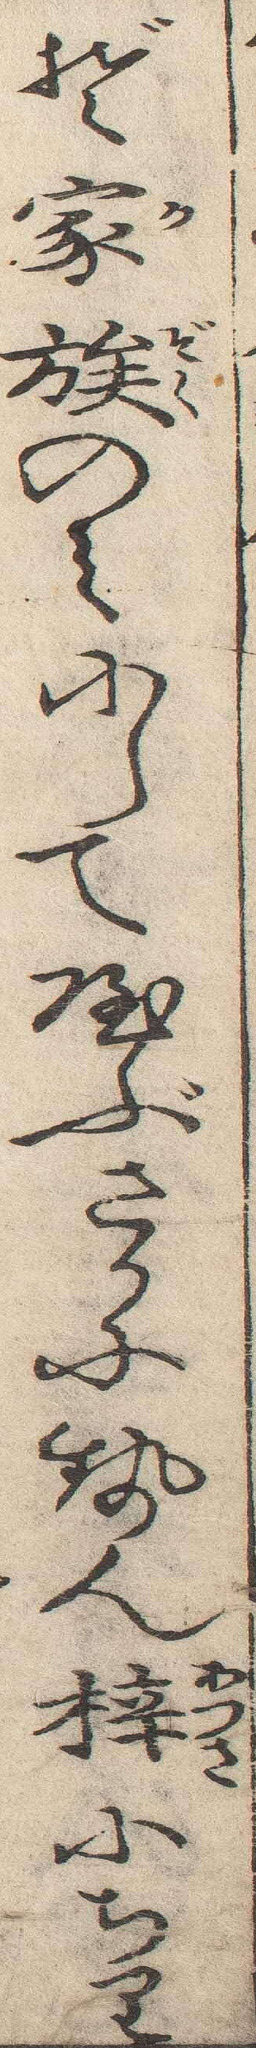ぞ家族のみにしてやぶさかにせん梓にちり
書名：小児必用養育草
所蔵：東京学芸大学附属図書館 国文学研究資料館
